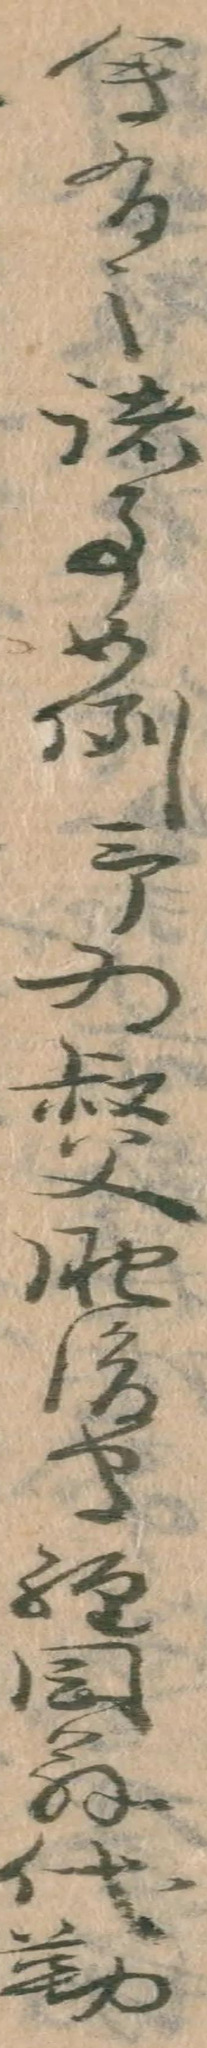會有之、諸事如例、予為叔父肥後守経岡翁代勤
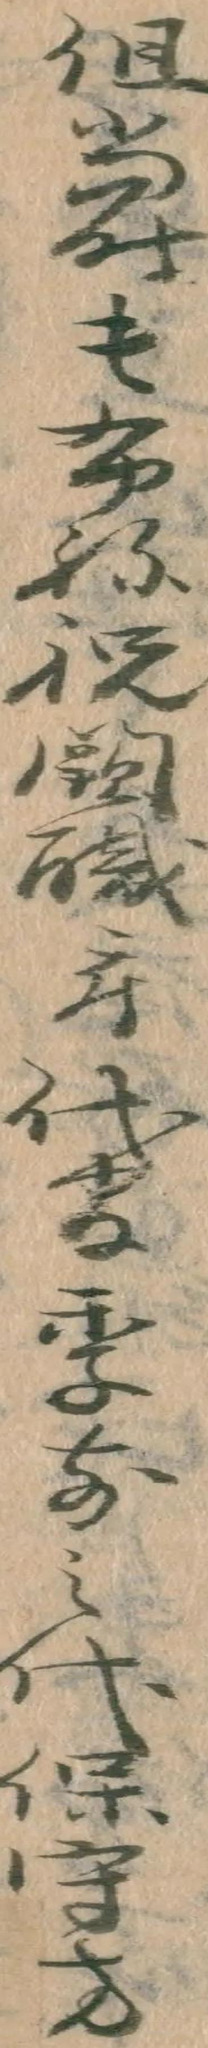但當時貴布祢祝闕職ニ付、代官季前之代保守方
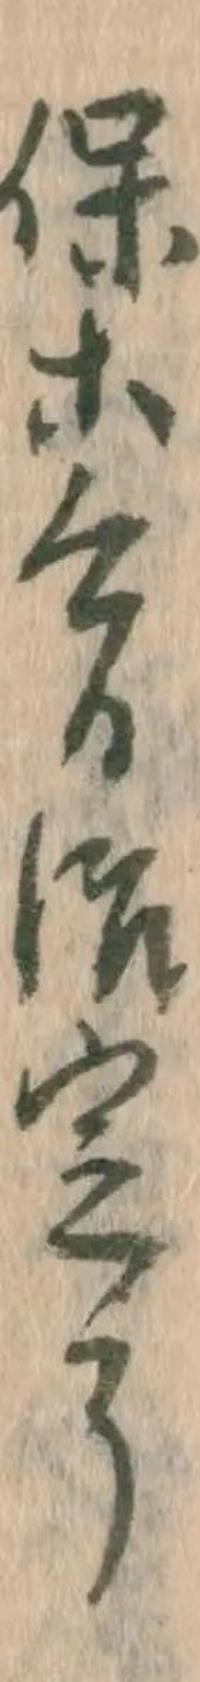保等今日治定了、
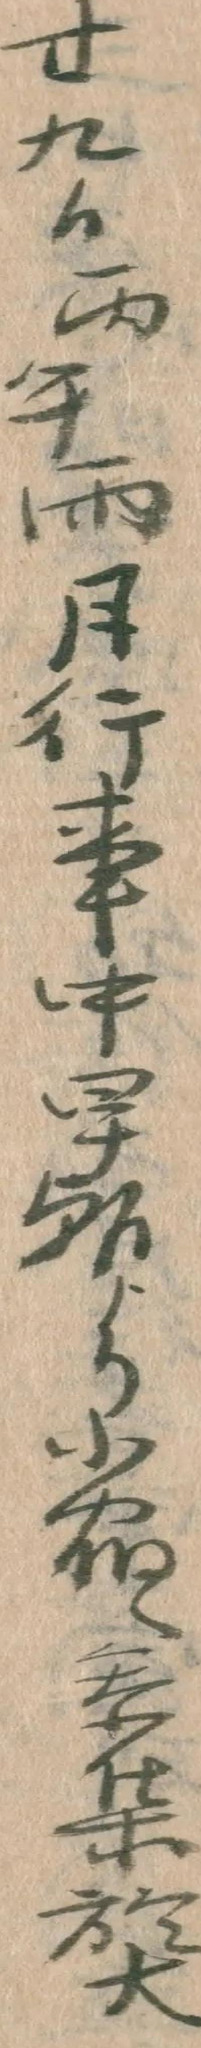廿九日丙午雨、月行事中早朝より小宿へ参集、於大
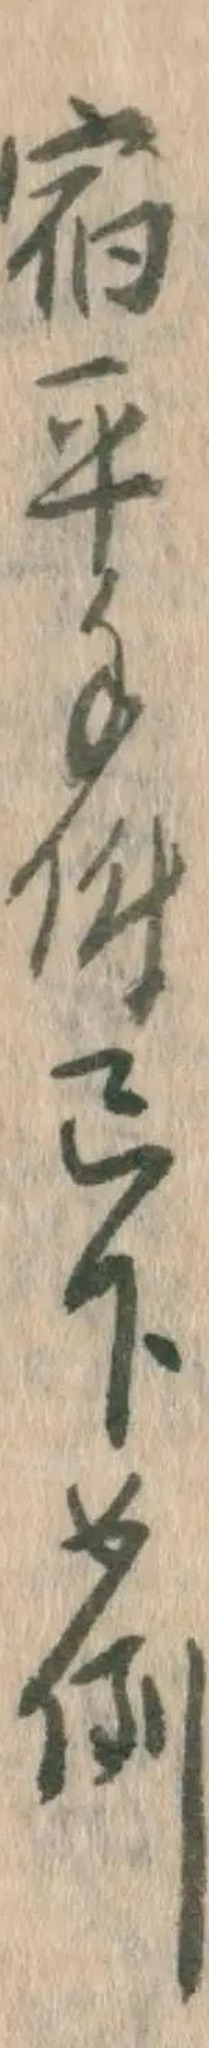宿平手附已下如例、
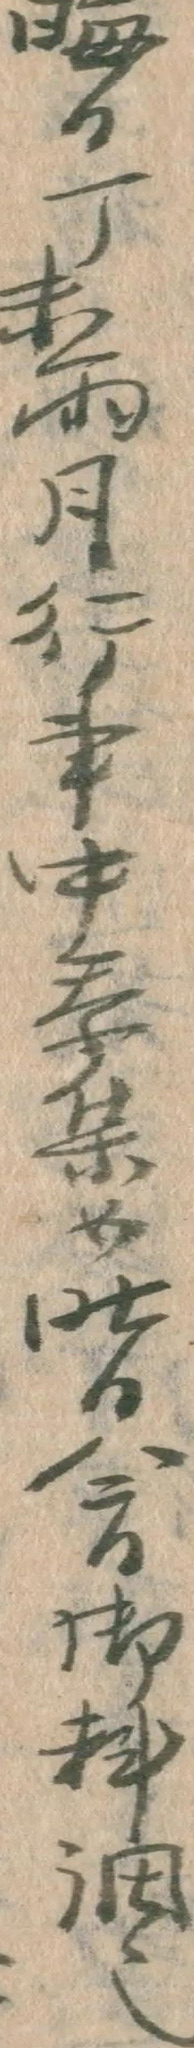晦日丁未雨、月行事中参集、如昨日今日御料調也、
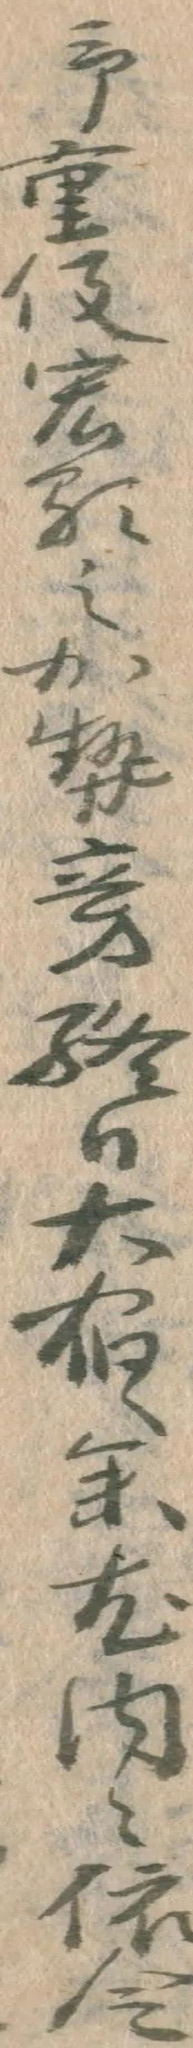予重役宏顕之加勢旁終日大宿へ参、尤内々依令
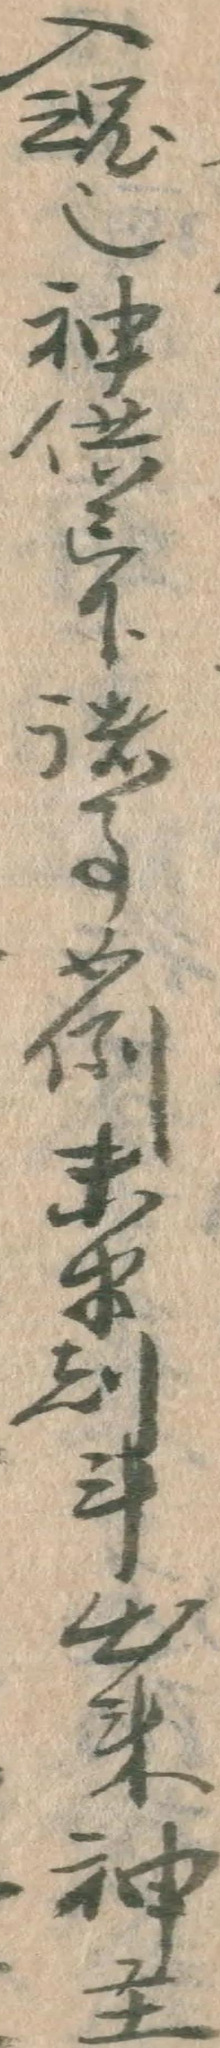入魂也、神供已下諸事如例、未半刻斗出来、神主
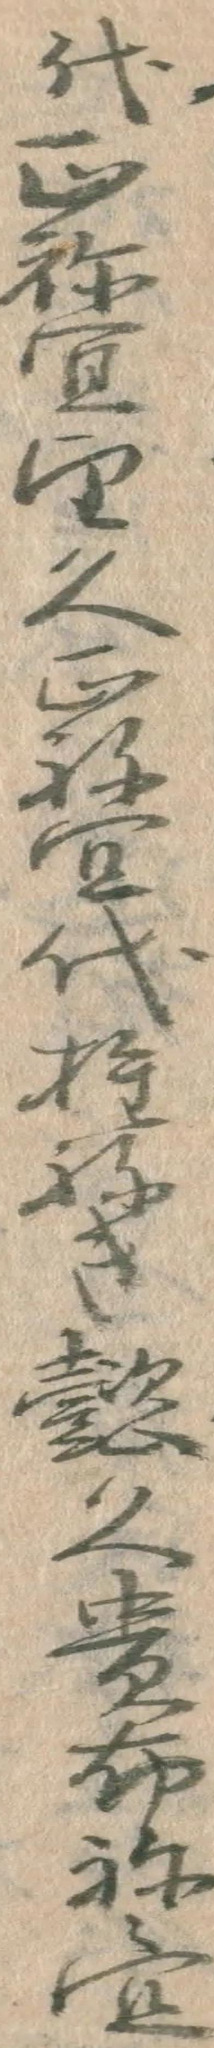代正弥宜望久・正祢宜代権ねき懿久・貴布称〻宜
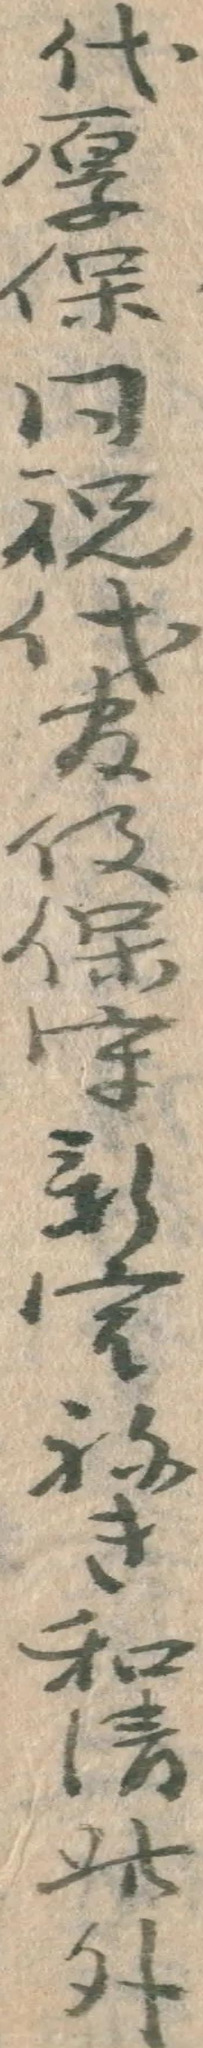代厚保・同祝代官役保守・新宮ねぎ和清、此外
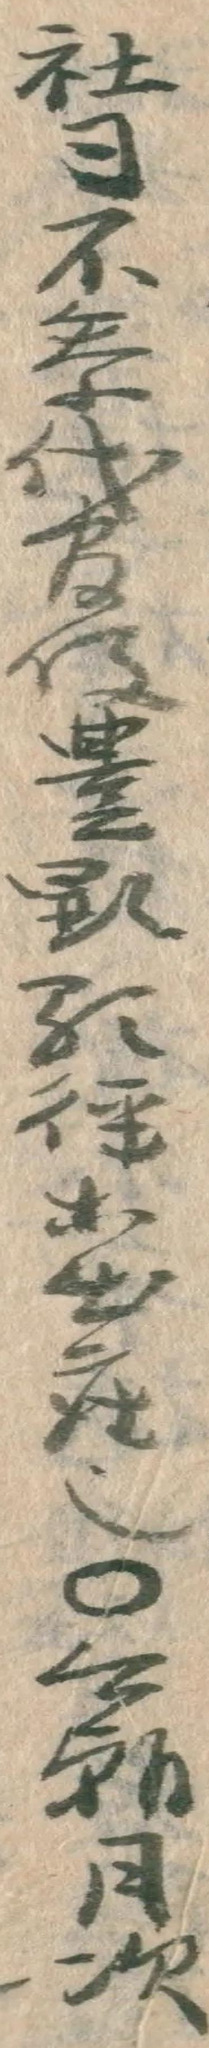社司不参、代官役豊顕・顕経等出座也、○今朝月次
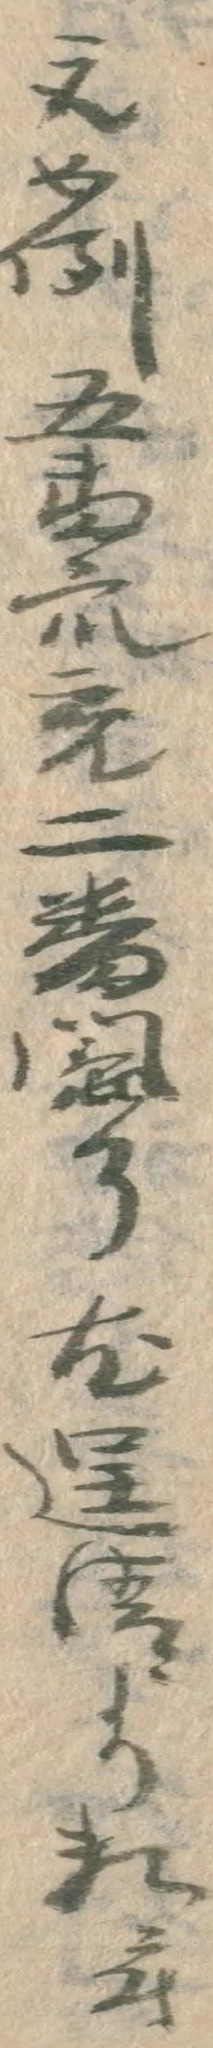取如例、五番衆充二番鬮了、尤逞請より頼ニ付
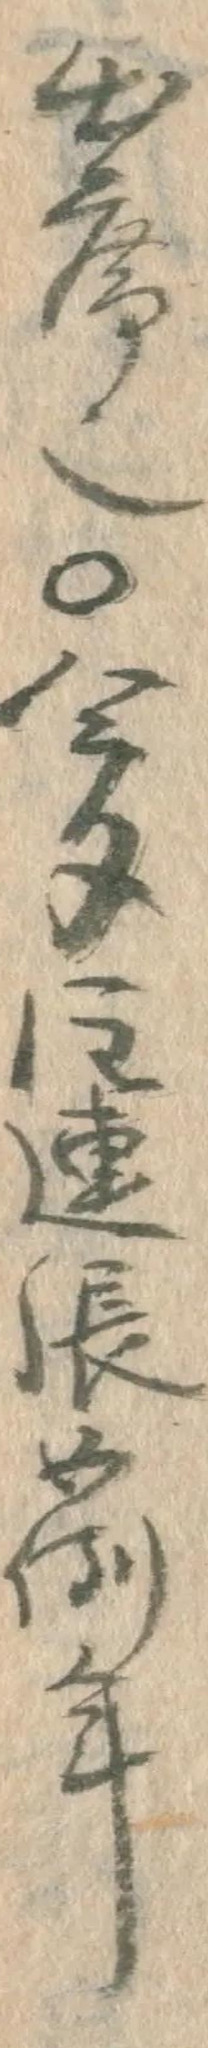出席也、○今夕注連張如例年、

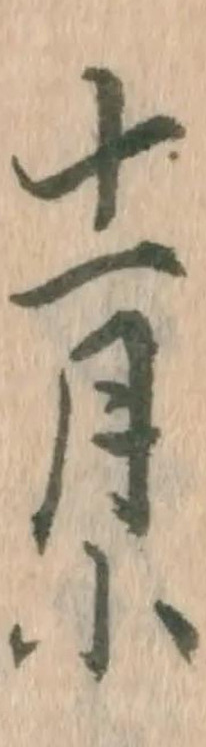十一月小
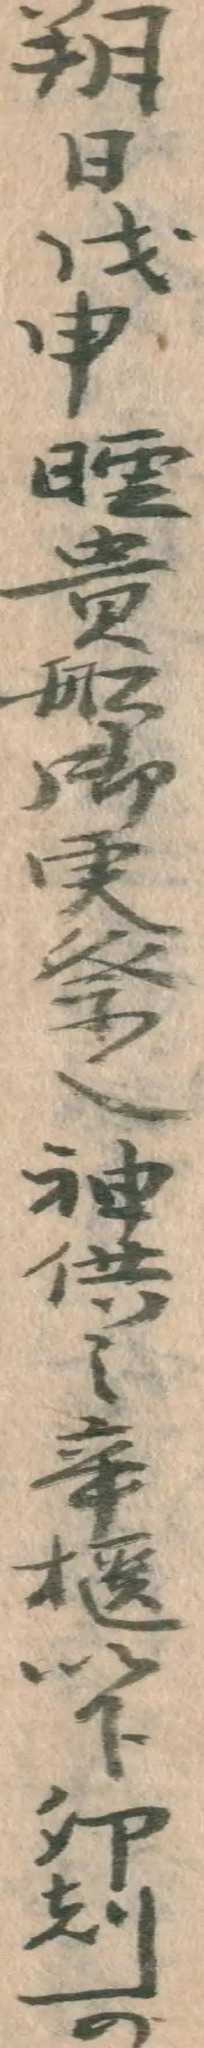朔日戊申曇、貴船御更祭也、神供之辛櫃以下、卯刻可
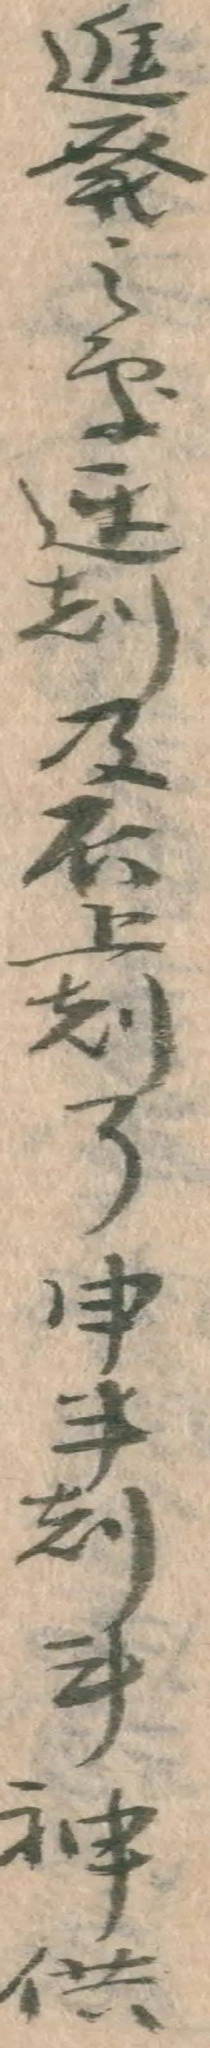近発之處遅刻及、辰上刻了、申半刻計神供
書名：賀茂社記録. 第63冊
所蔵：国立国会図書館 National Diet Library, JAPAN
